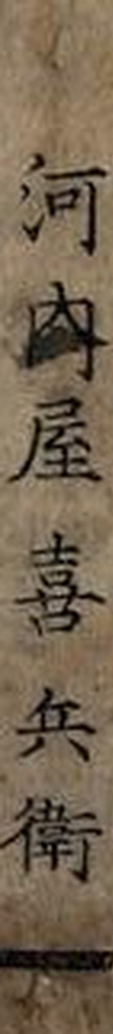河内屋喜兵衛
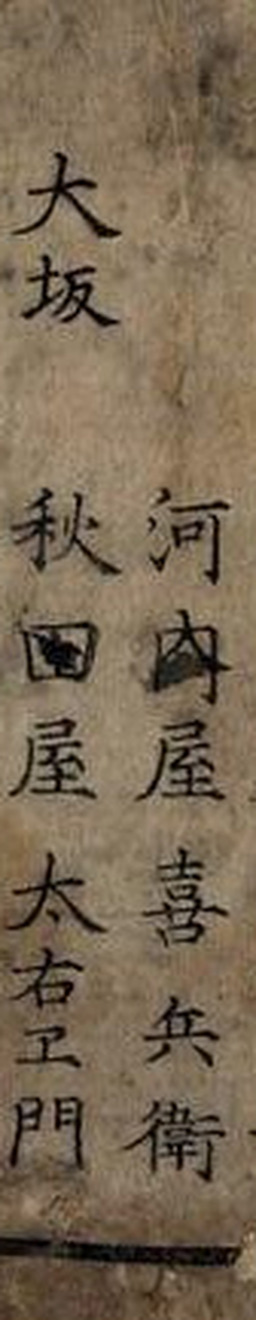大坂秋田屋太右ヱ門
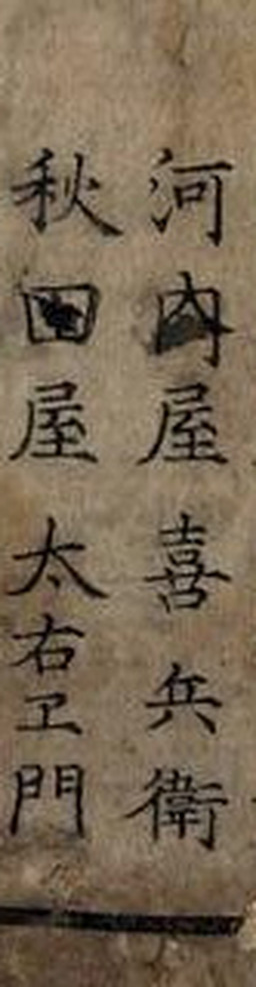大坂秋田屋太右ヱ門
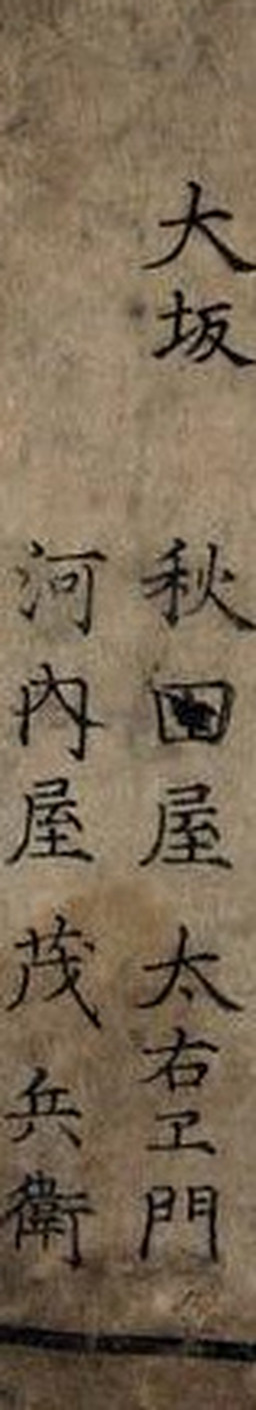河内屋茂兵衛
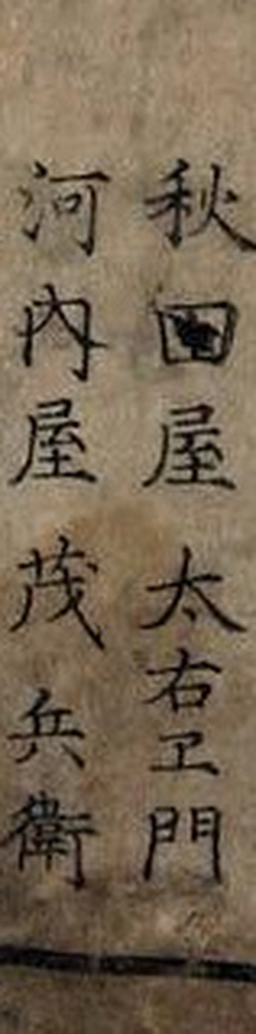河内屋茂兵衛
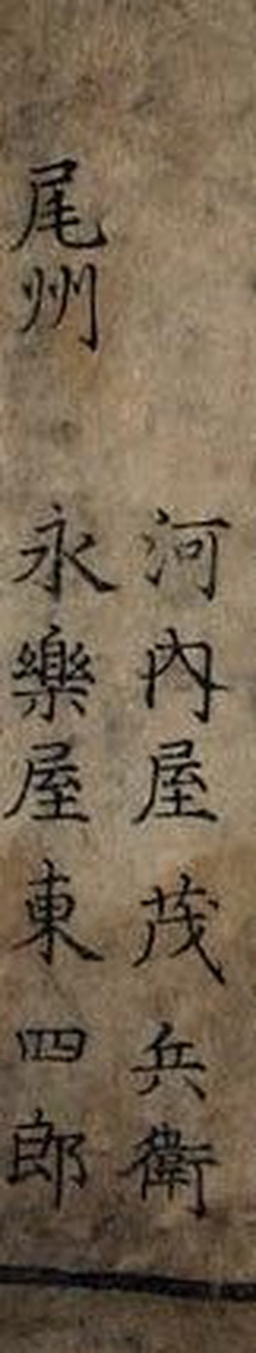尾州永楽屋東四郎
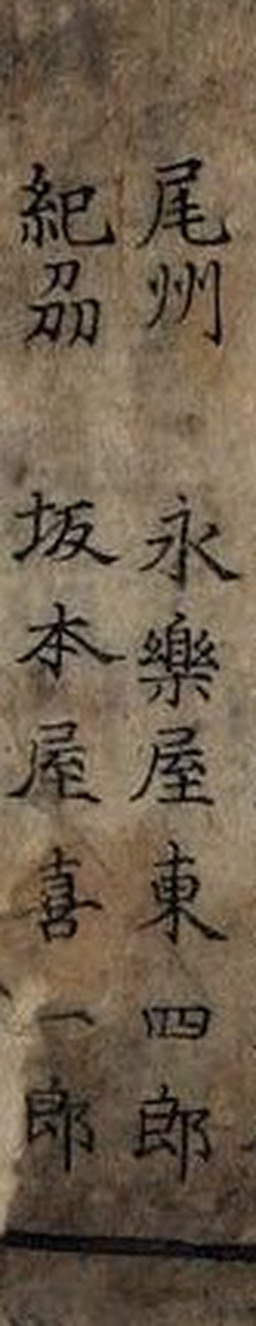紀刕坂本屋喜一郎
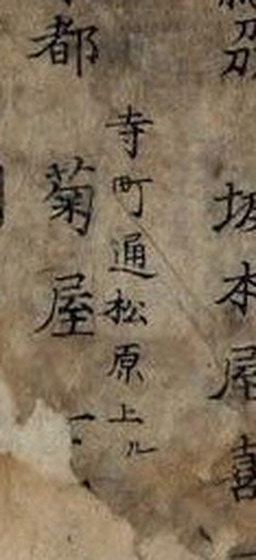寺町通松原上ル

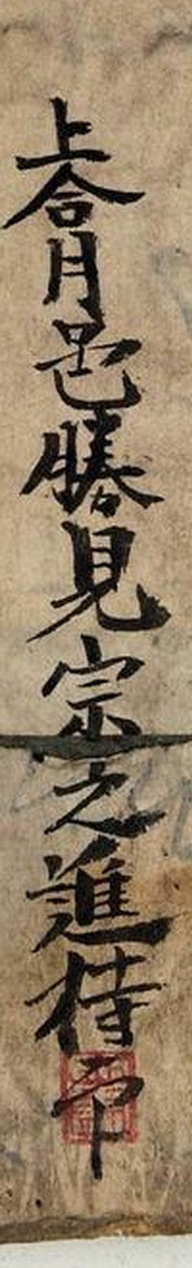上合月邑勝見宗之進持印
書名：大成用文章（往来物）
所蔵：福井県文書館 Fukui Prefectural Archives
